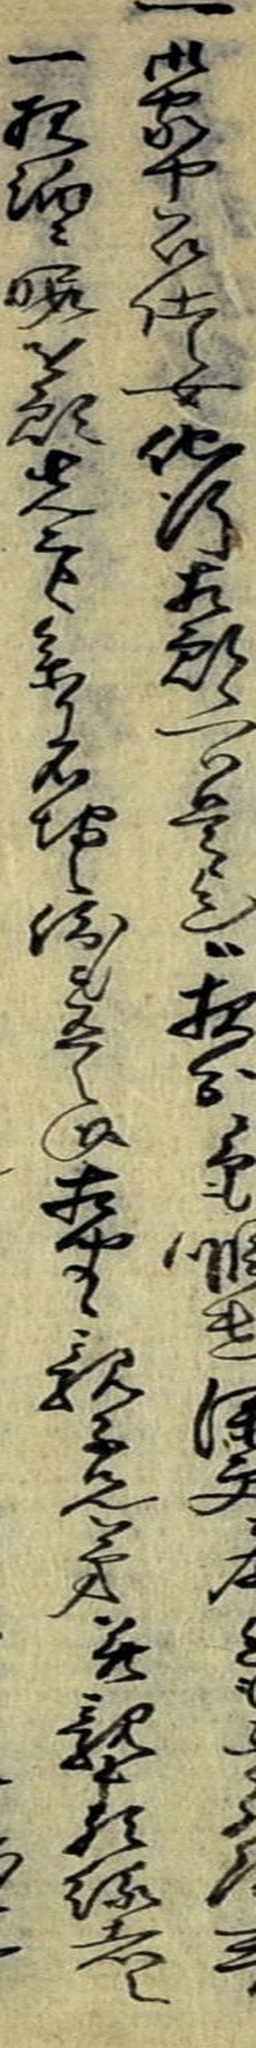一夜泊ニ暇を願先方へ参り不埒之儀も有之趣相聞候親子兄弟并親類縁者之
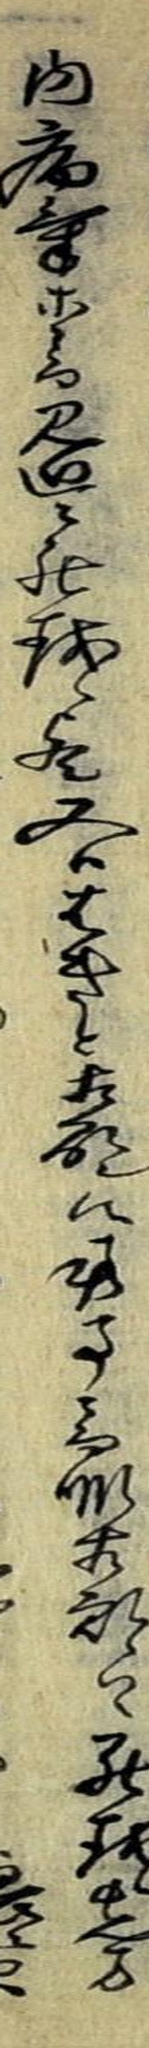内病気等ニ而見廻ニ罷越候歟又ハはきと相顕レ候用事ニ而暇相願候ハヽ罷越候先方
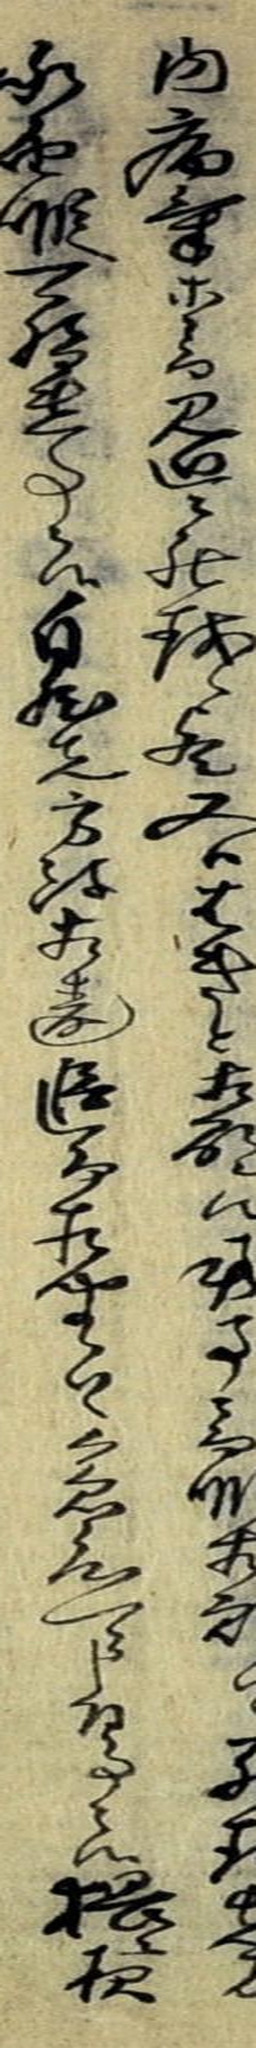承届暇可指遣事ニ候自然先方致相違追而相聞候ハヽ急度可申付事ニ候猥ニ夜
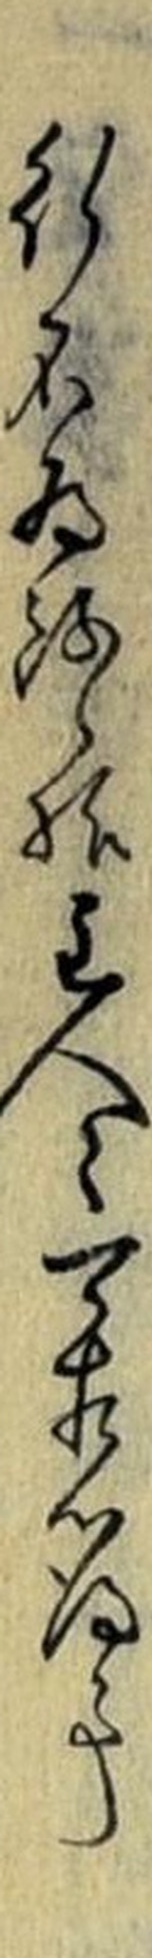行不為致候様主人々可相心得事
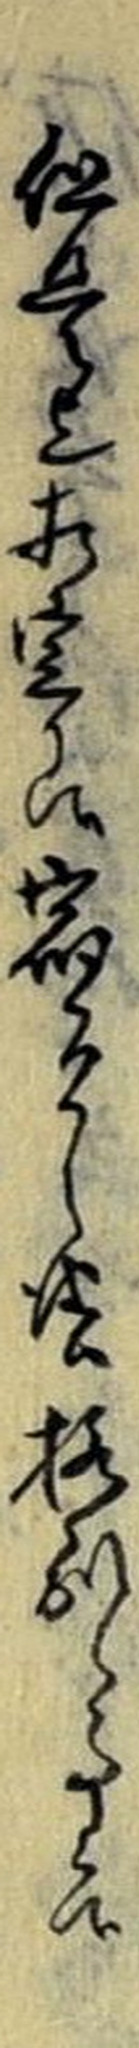但是迄相定り候宿下り之儀ハ格別之事ニ候
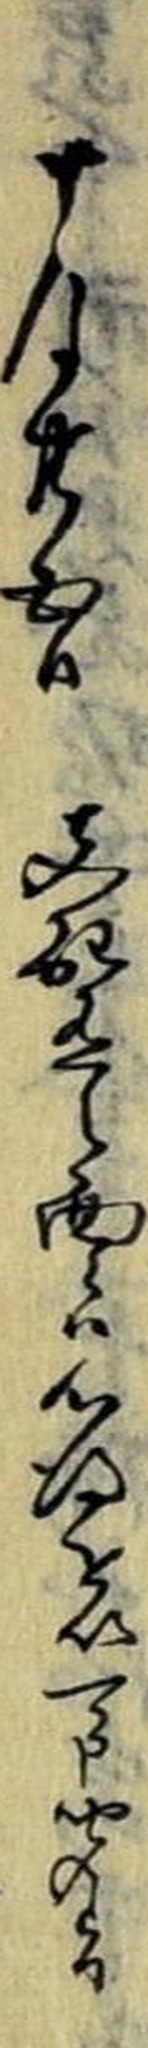十月廿五日支配有之面々ハ心得を以可申聞旨
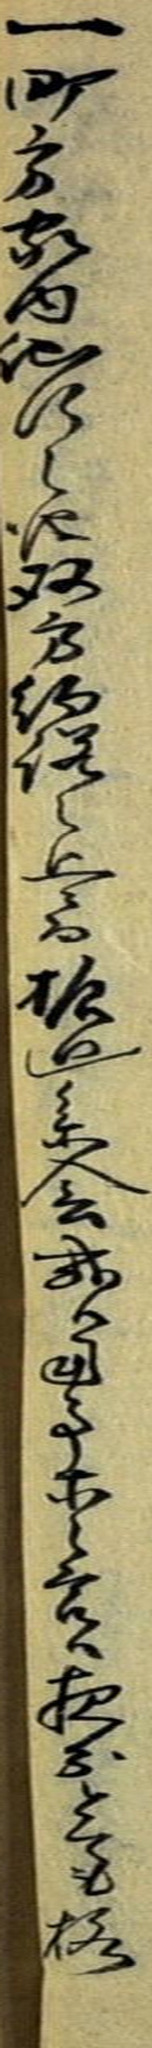一町方家内他行之儀双方約諾之上ニ而振廻集会或ハ用事等之節ハ夜分とても格
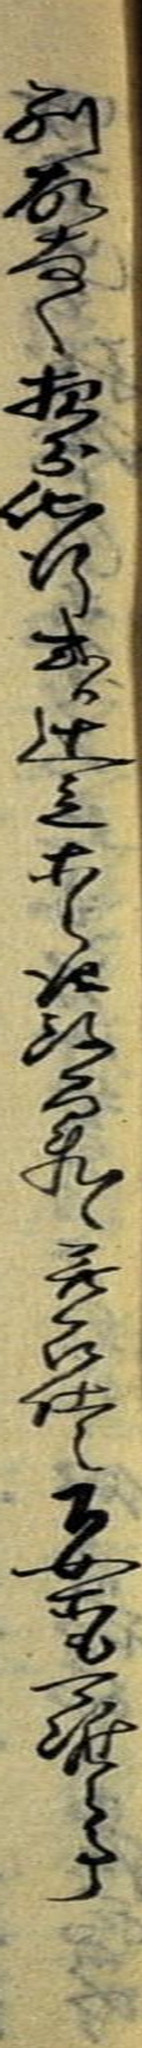別故なく夜分他行或ハ辻立等之儀致間敷候并召仕候下女等も可准候事
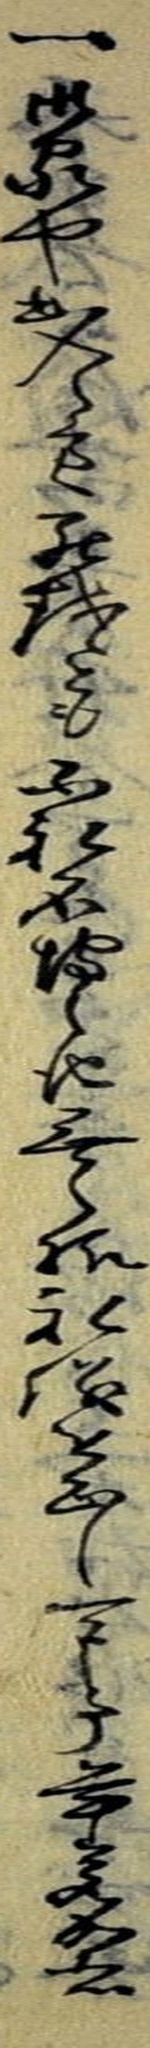一御家中出入之方へ罷越候とも不礼不埒之儀無之様礼儀を正し可申事年若成者
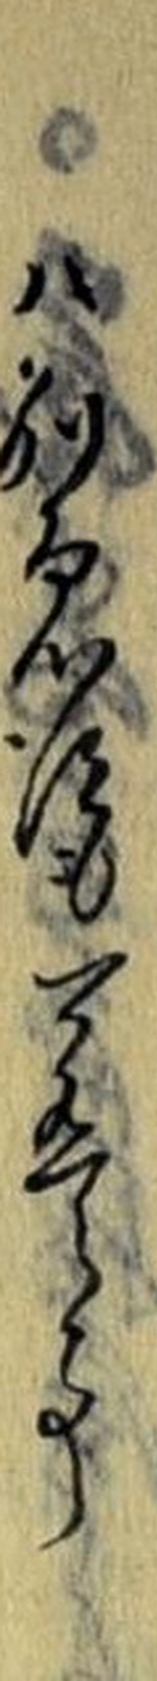ハ別而心得も可有之事
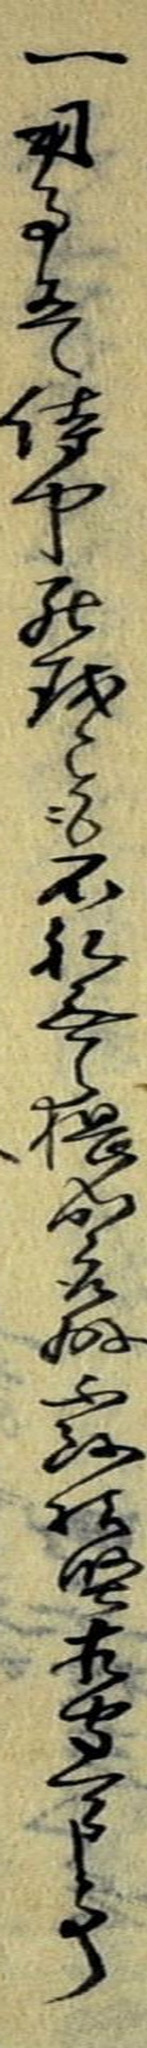一用事有之侍中罷越候とも不礼無之猥成取扱不致様堅相守可申事
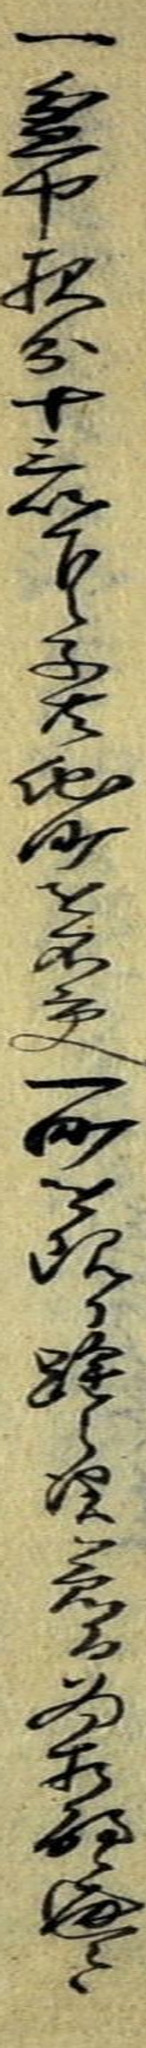一盆中夜分十三以下子共他町を不交一町を限り躍之儀ハ兼而為相触候通ニ候
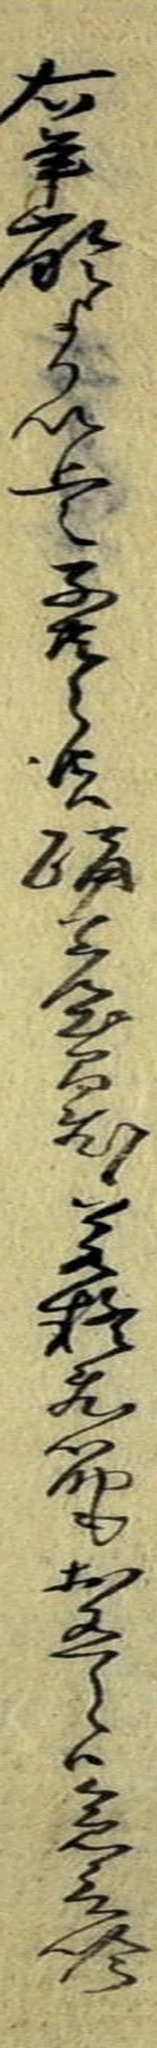右年齢より以上之子共之儀ハ踊差出間敷候若疑敷筋も於有之ハ急度吟
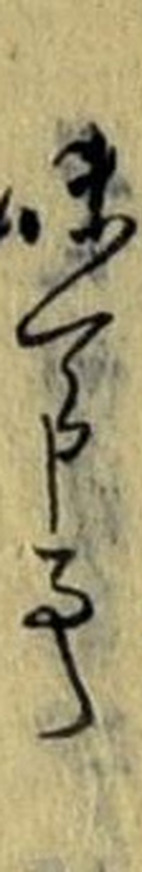味可申事
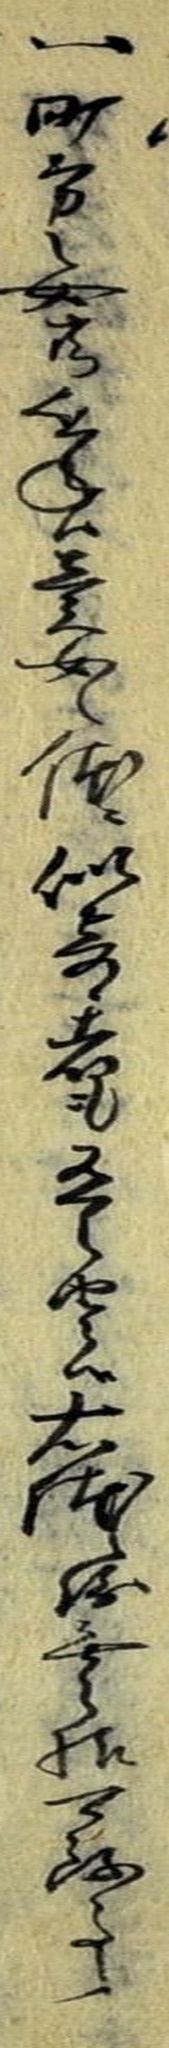一町方之女共近年ハ売女之体ニ似寄候者も有之由ニ候右体之儀無之様可致事
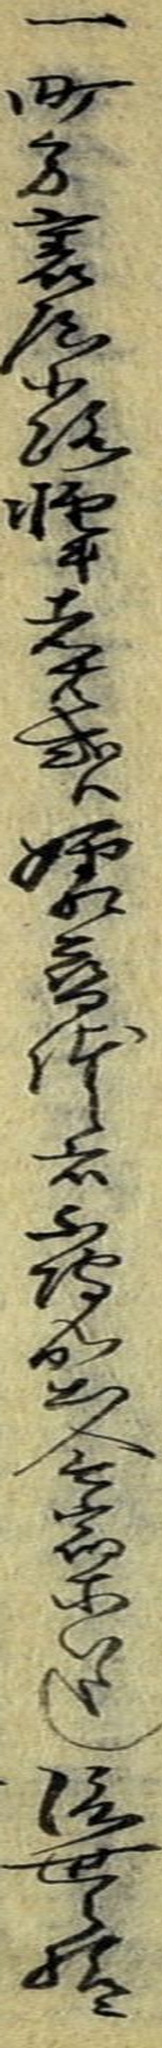一町方裏道小路軽キ者共或ハ孀暮体之者不埒成出会宿等いたし渡世之様ニ
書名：命令之部 三
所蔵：福井県文書館 Fukui Prefectural Archives
